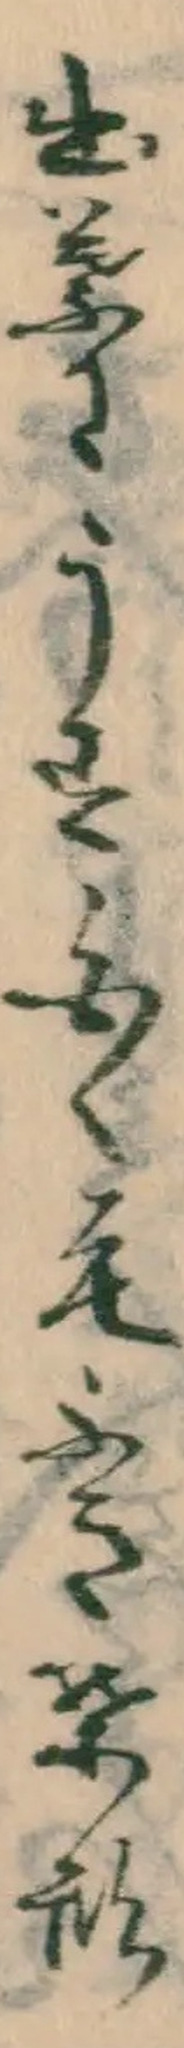出葉にうす白く毛ふき葉形
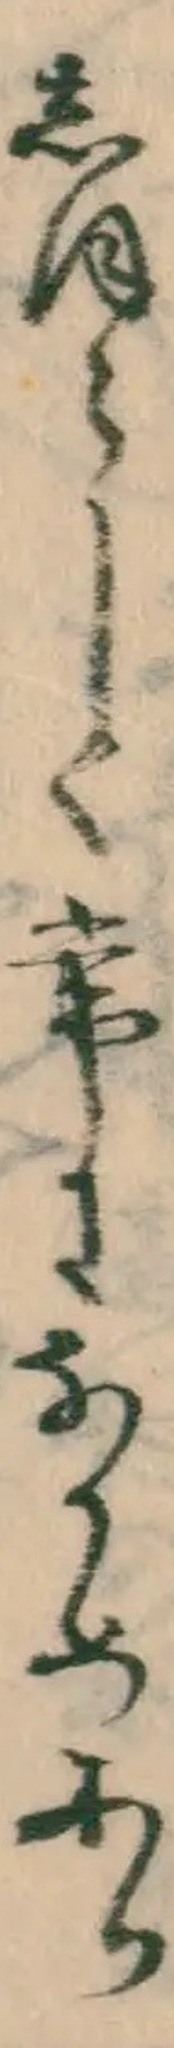しほらしく常にながめあり
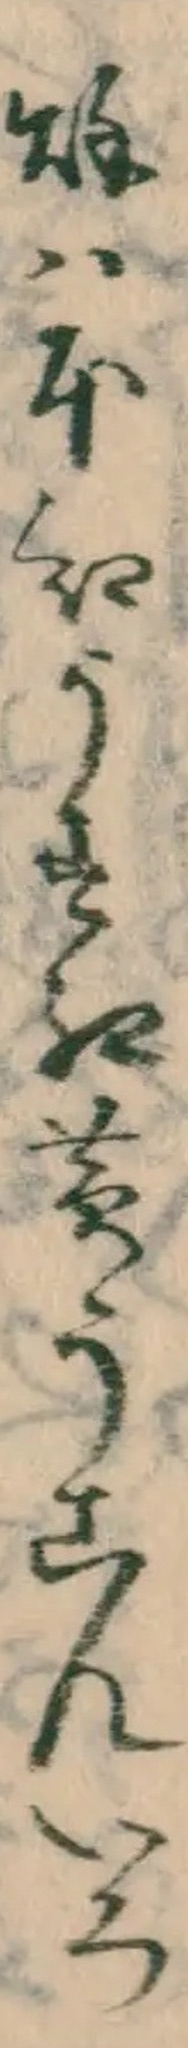秋は本紅うす紅黄うこんいろ
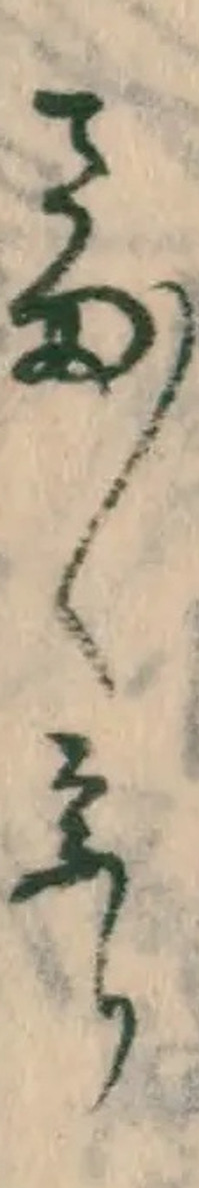さま〳〵なり
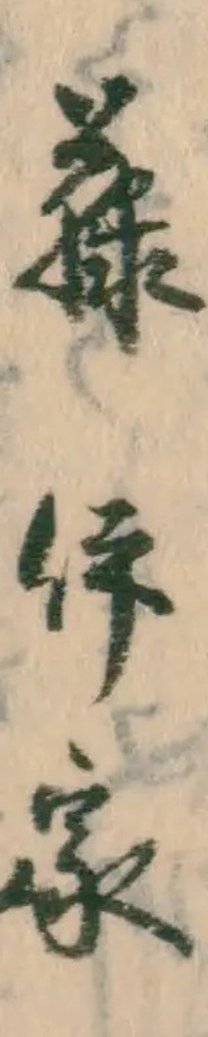藤伊家
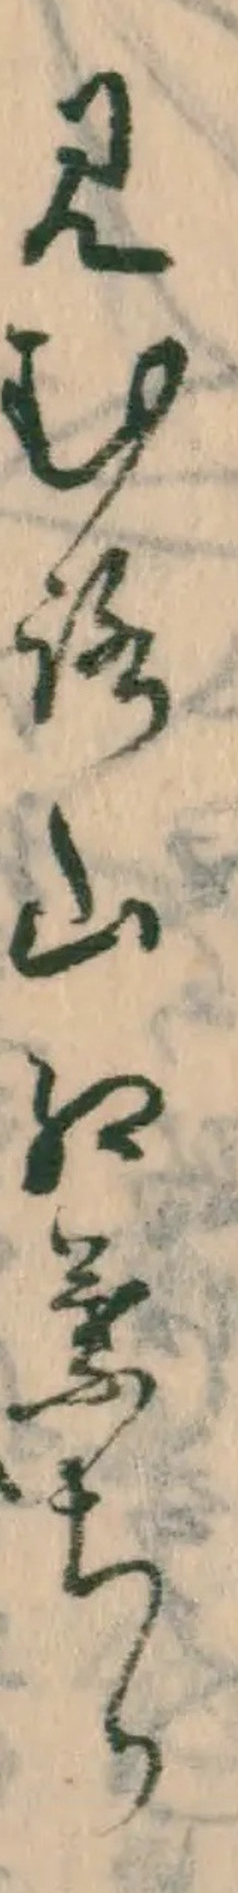みむろ山紅葉ちり
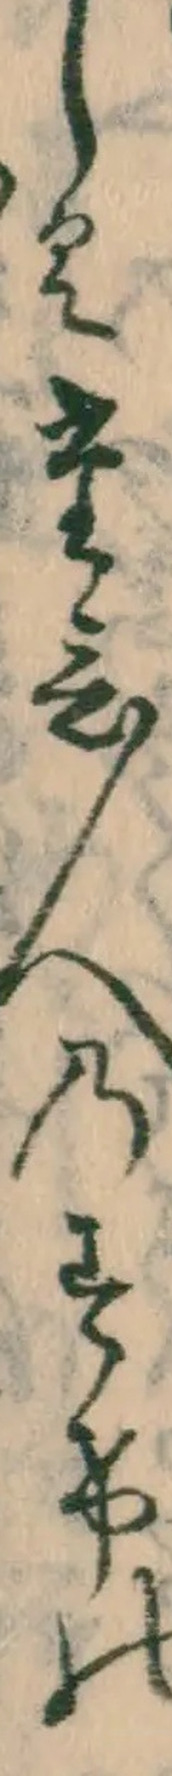しくたひ人のすけの
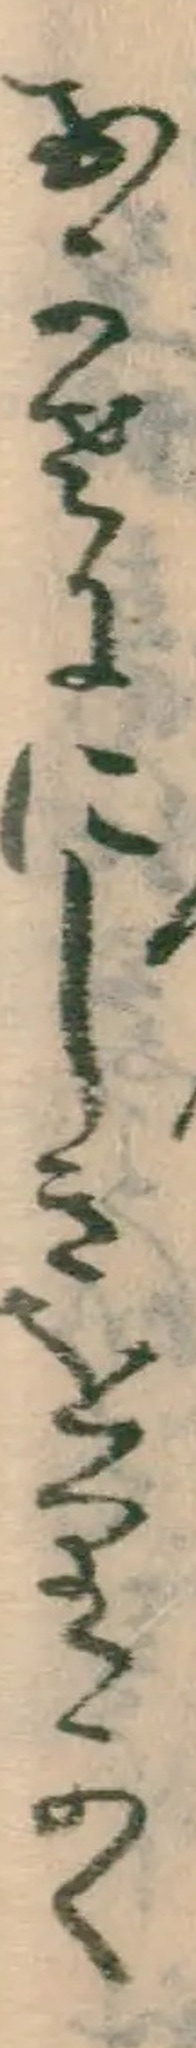おかさににしきをりかく
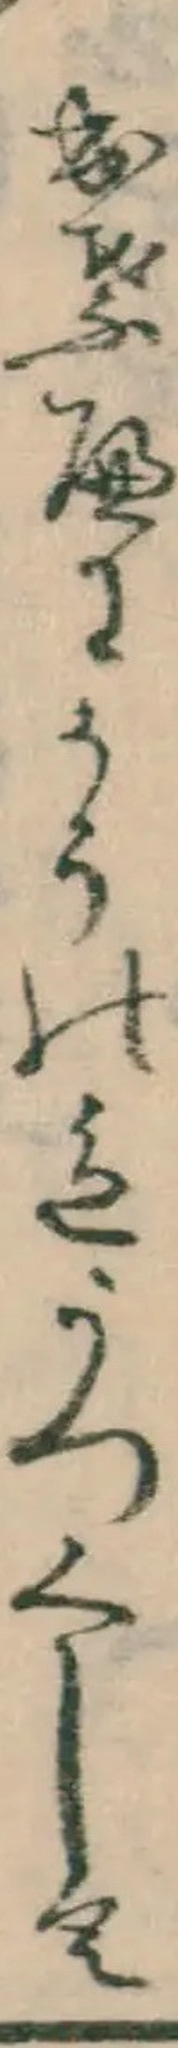出葉へにかうの色うつくしく
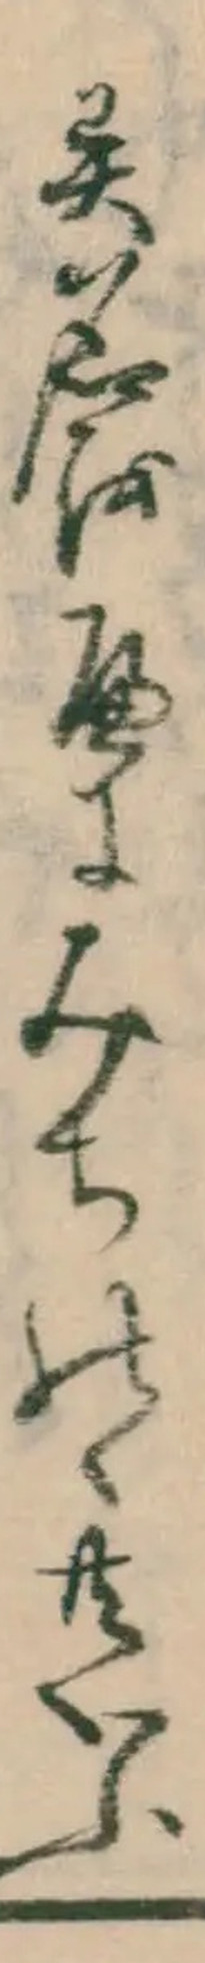異名をへにみちのく共いふ
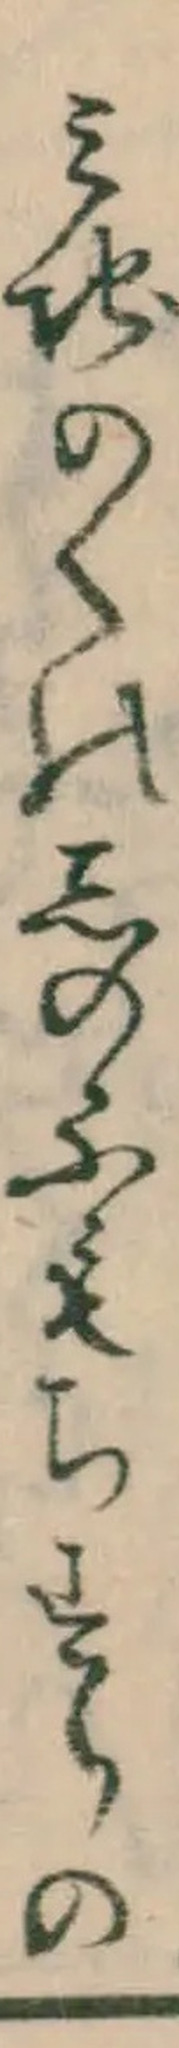みちのくのしのふもちすりの
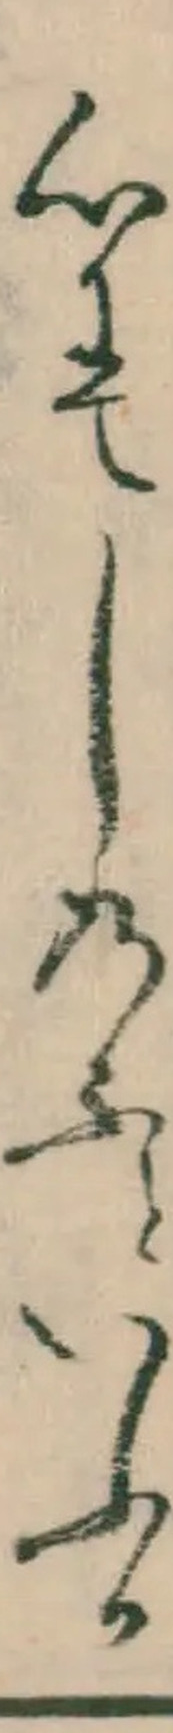心にてしのふといふか
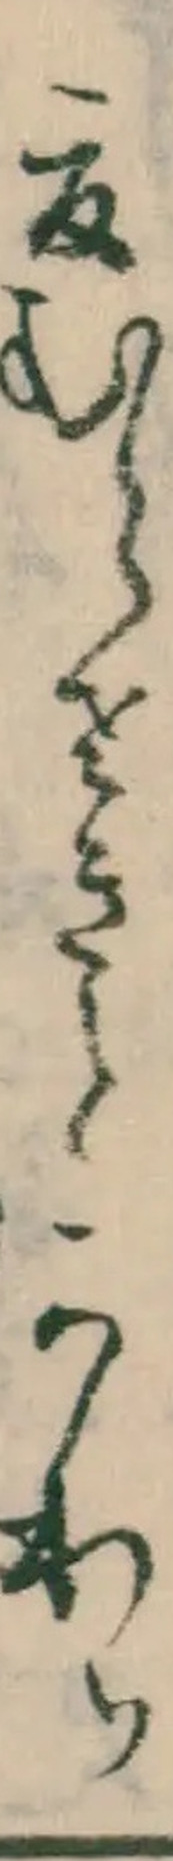夏むらさきとかわり
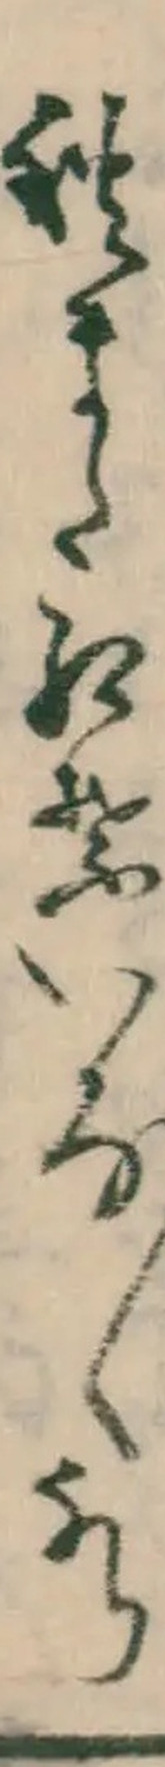秋また紅葉いろ〳〵なり
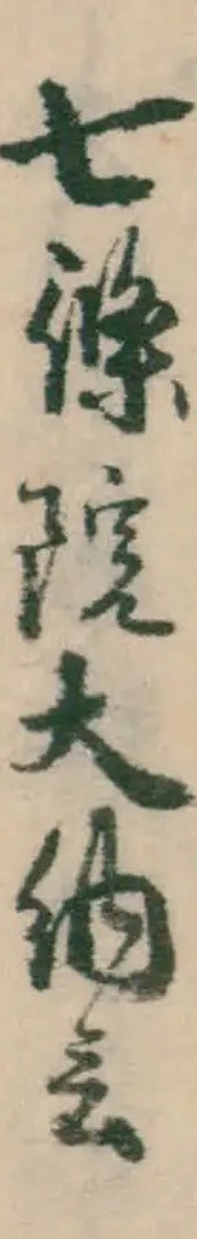七條院大納言
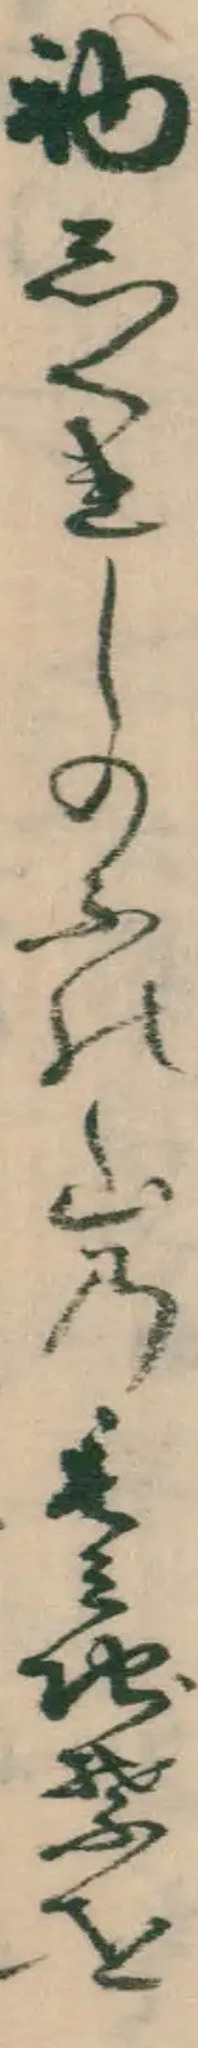初しくれしのふの山のもみち葉を
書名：紅葉集
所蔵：国立国会図書館 National Diet Library, JAPAN
